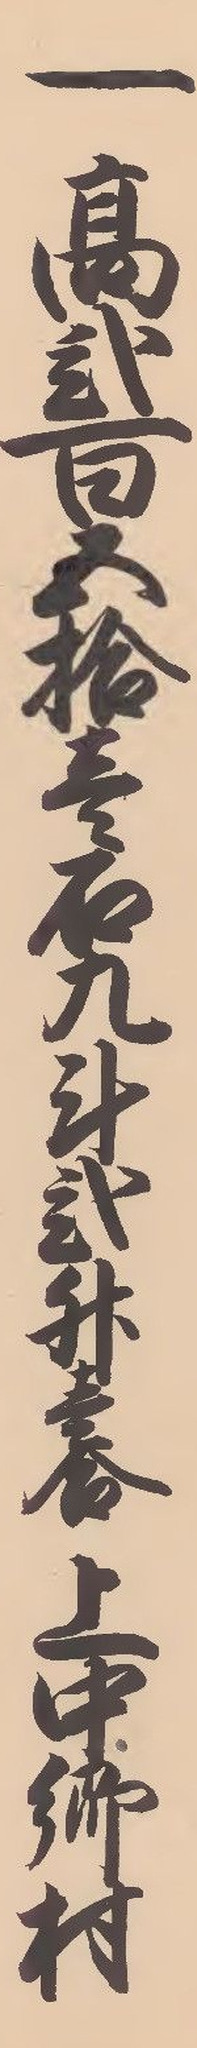一高弐百五拾壱石九斗弐升壱合上中郷村
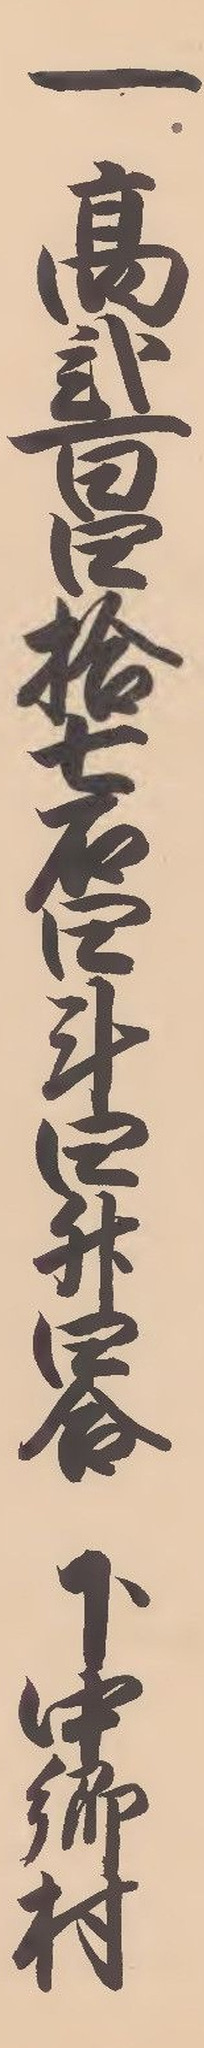一高弐百四拾七石四斗四升四合下中郷村
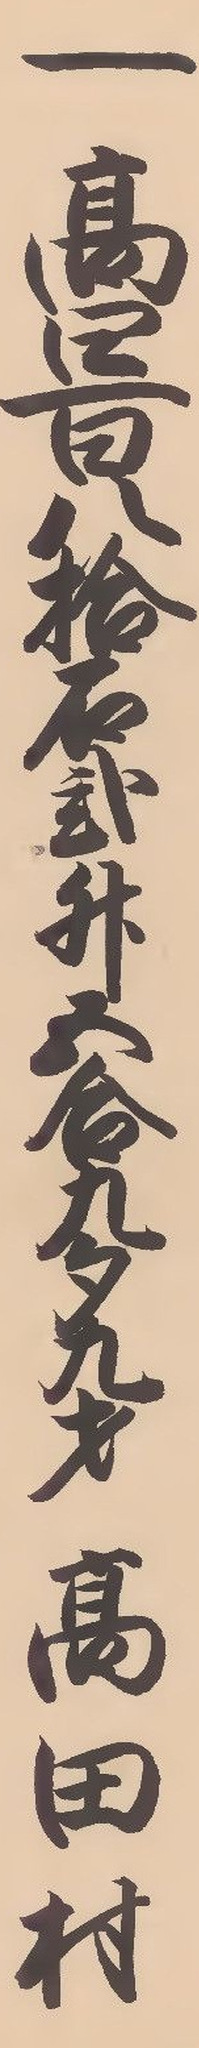一高四百八拾石弐升五合九勺九才高田村
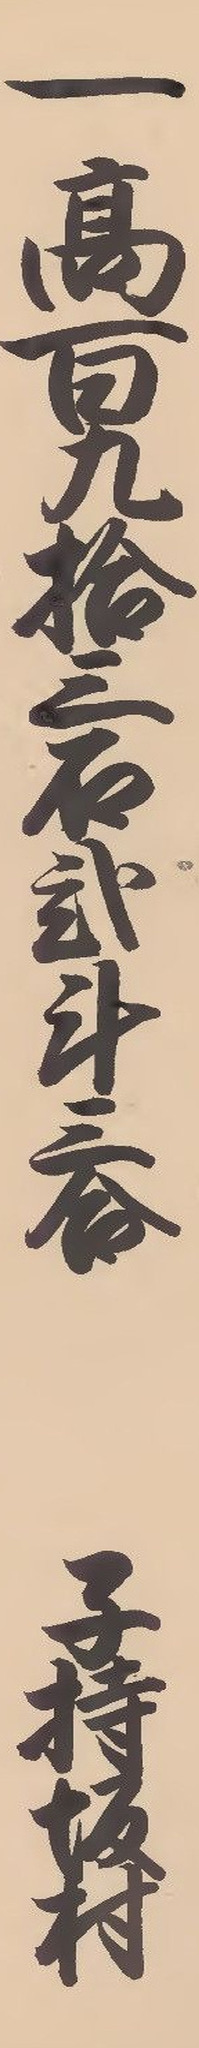一高百九拾三石弐斗三合子持坂村
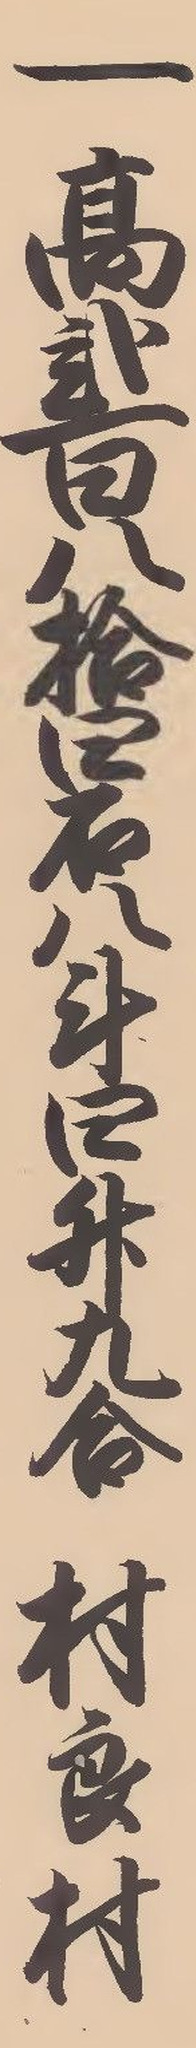一高弐百八拾四石八斗四升九合村良村
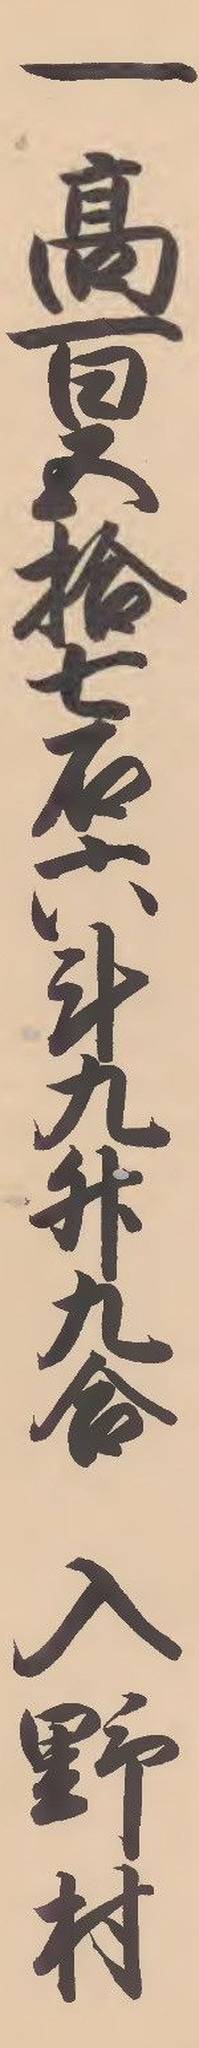一高百五拾七石六斗九升九合入野村

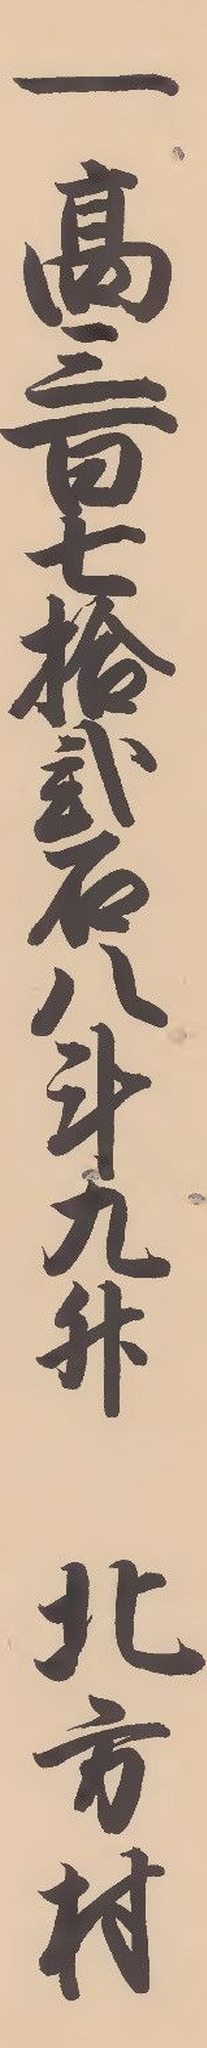一高三百七拾弐石八斗九升北方村
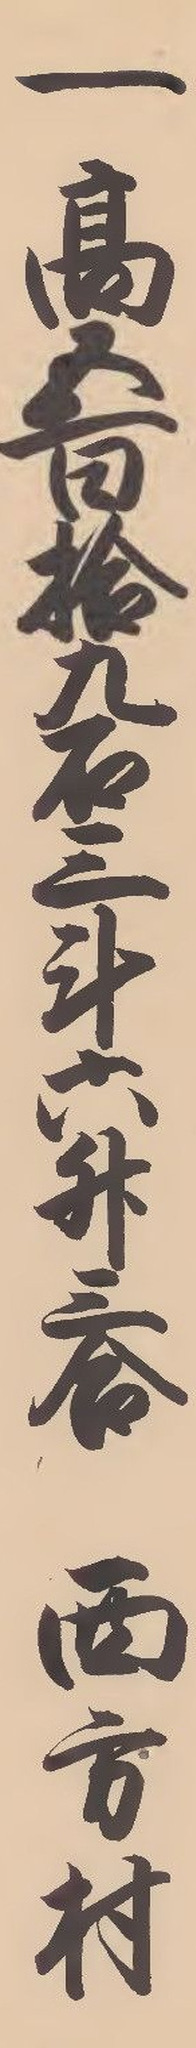一高五百拾九石三斗六升三合西方村
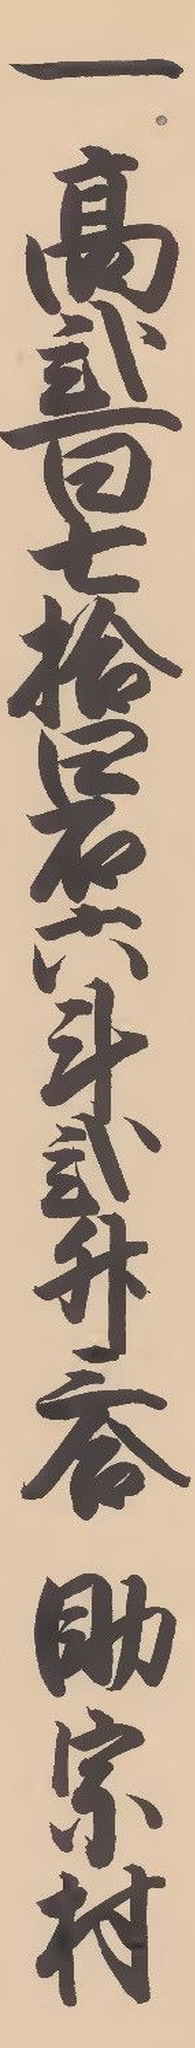一高弐百七拾四石六斗弐升三合助宗村
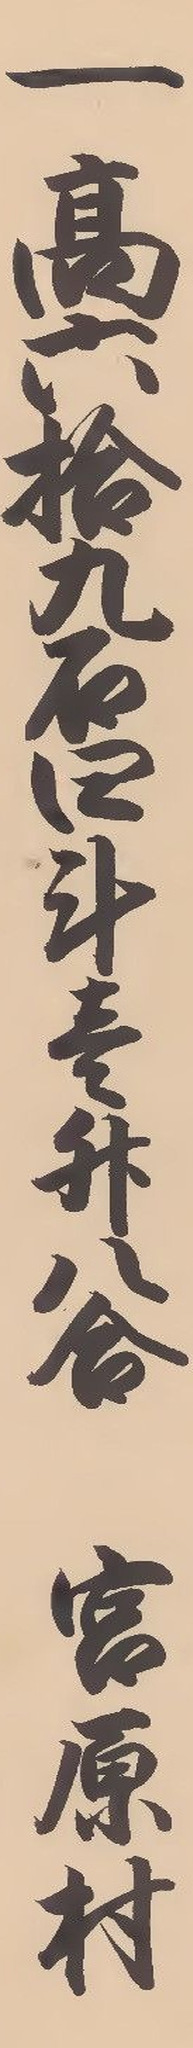一高六拾九石四斗壱升八合宮原村
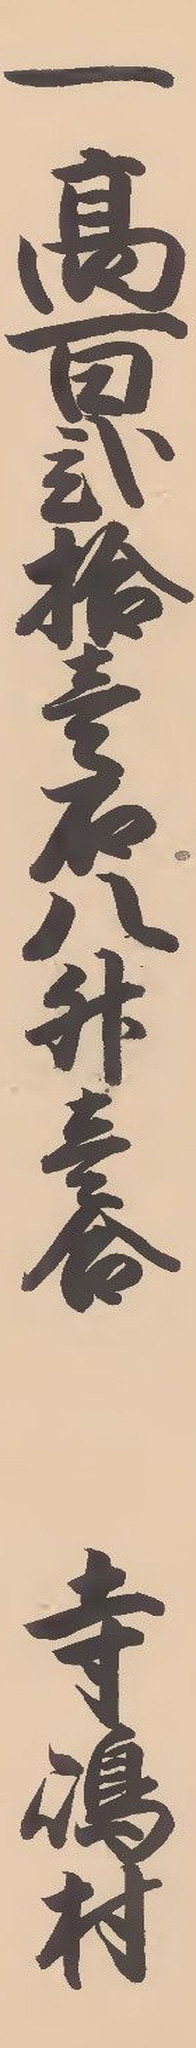一高百弐拾壱石八升壱合寺島村
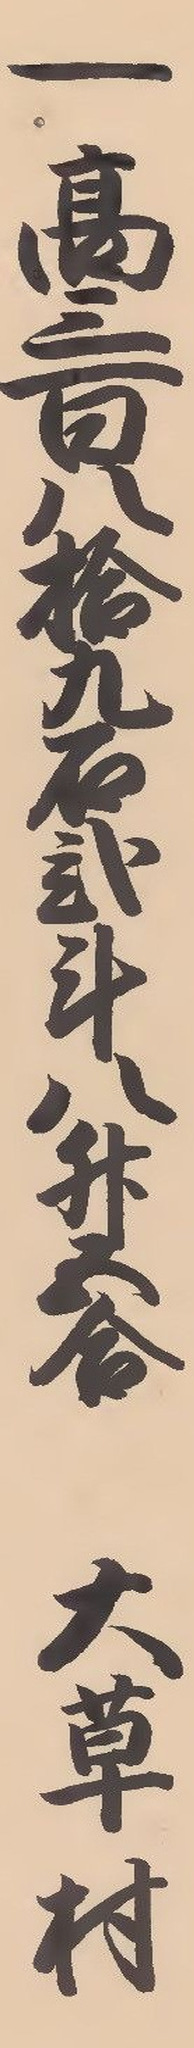一高三百八拾九石弐斗八升五合大草村
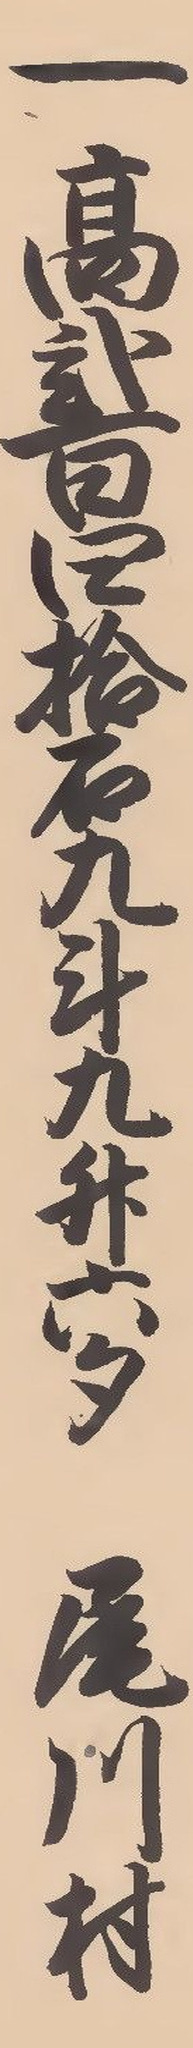一高弐百四拾石九斗九升六勺尾川村
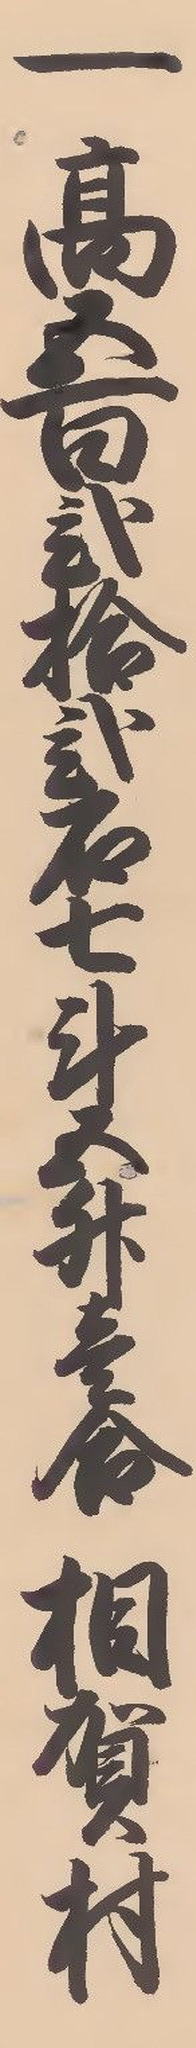一高五百弐拾弐石七斗五升壱合相賀村

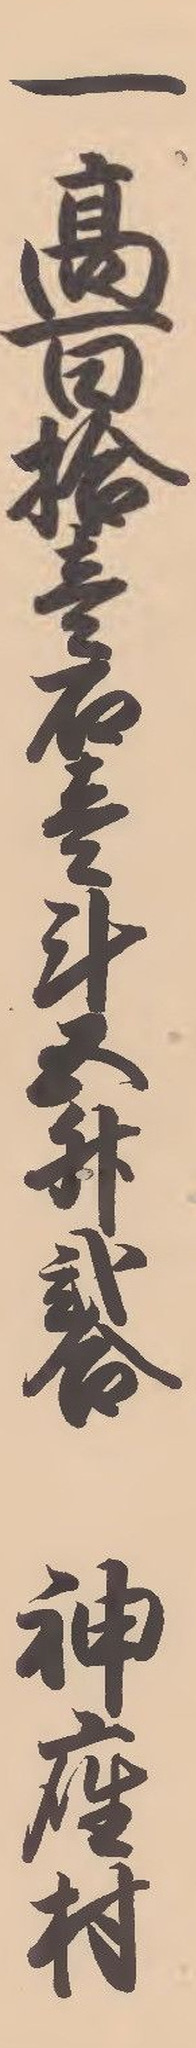一高百拾壱石壱斗五升弐合神座村
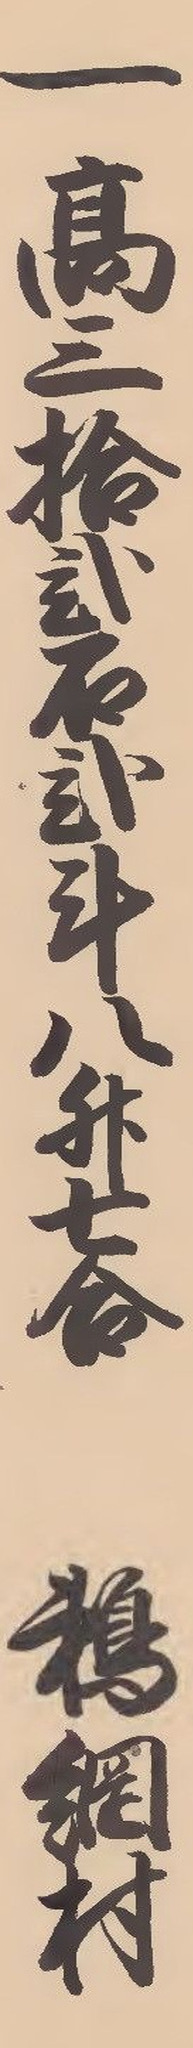一高三拾弐石弐斗八升七合鵜網村
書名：駿河国郷帳
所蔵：国立公文書館 National Archives of Japan
